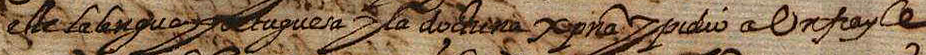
este la lengua portuguesa y la doctrina xpnā y pedio a vn frayle
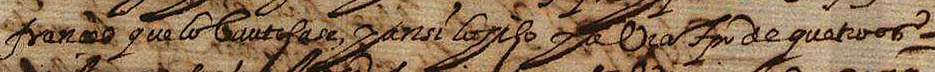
frances que lo bautizase, y ansi lo hizo y avia tpō de quatro as̄
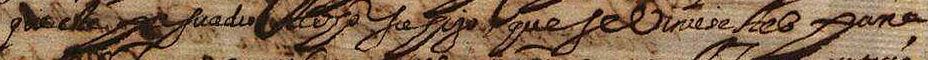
que este pesuadio Al dhō su hijo que se viniese A espanā
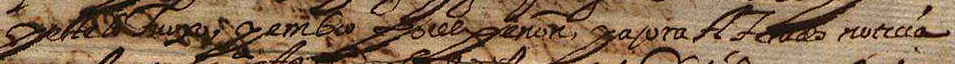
y este lo truxo, y embio por el penōr, y aora A tenido noticia
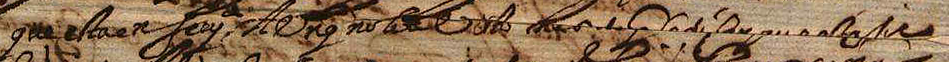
que esta en seuj.a Avnq̄ no le a visto mas lo q_ le dizen que esta sir
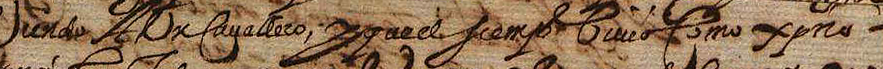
Viendo A Vn Cauallero, y que el siempre biuio Como xpnō
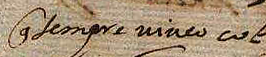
q̄ sempre uiueo co
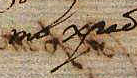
mo xpaõ
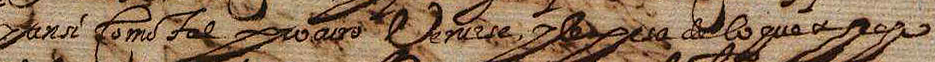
y ansi Como tal procuro Venierse, y le pesa de lo que a hecho
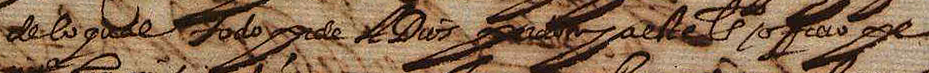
de lo qual todo pide A Dios perdon y a este sto / officio pe
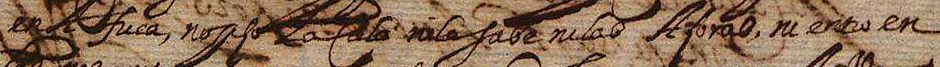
en Africa, no hizo La Çala ni la sabe ni las Azoras, ni entro en
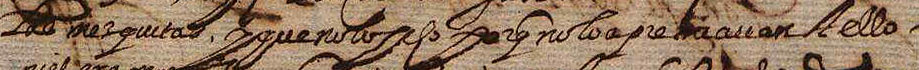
Las mezquitas. y que no lo hizo porq̄ no lo apremeauan A ello
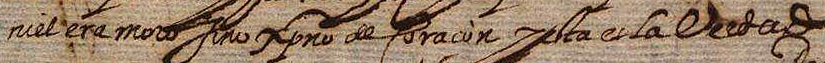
ni el era moro sino xpn̄o de Coraçon y esta es la Verdad
